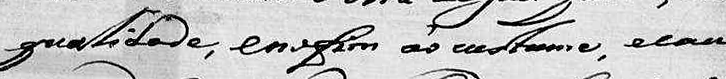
qualidade, e no fim ào custume, e cau
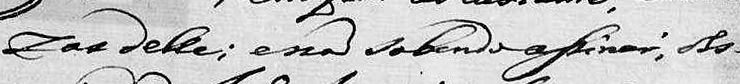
Zas delle; e naõ sabendo assinei, o es
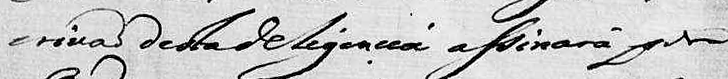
criuaõ desta deligencia assinará por
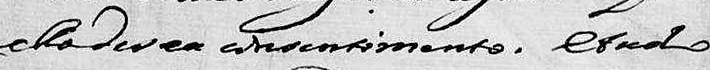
ella de seu consentimento. e tudo
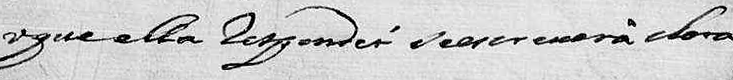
o que ella Responder se escreuerà clara
